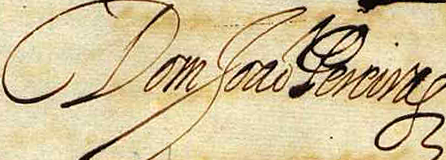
Dom Joaõ Pereira
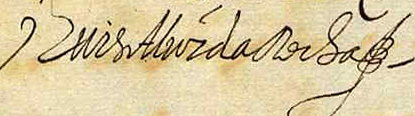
Luis Aluz̄ da Rocha
